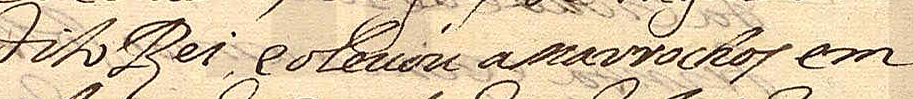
dito Rei, e o leuou a marrochos em
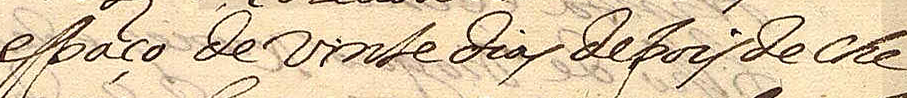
espaço de vinte dias depois de che
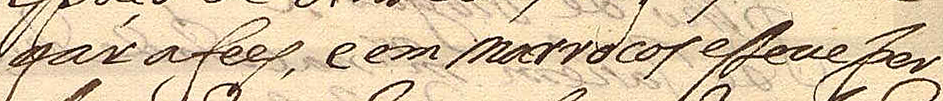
gar a fees, e em marrocos esteue per
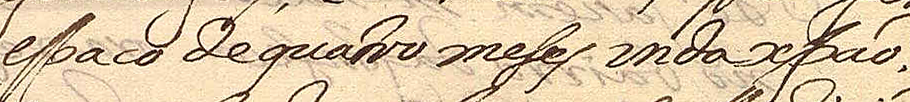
espaço de quatro meses inda xpaõ
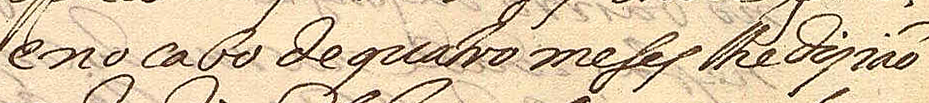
e no cabo de quatro meses lhe diziaõ
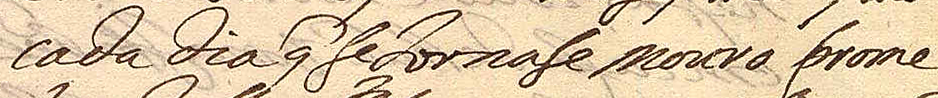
cada dia q̄ se tornase mouro prome
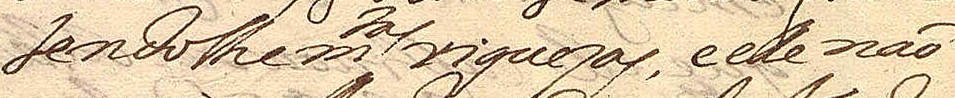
tendolhe mtas riquezas, e elle naõ
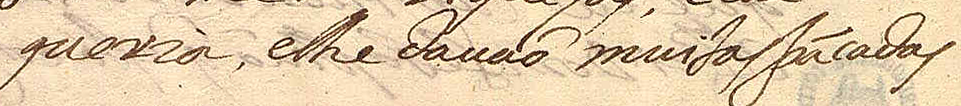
queria, e lhe dauaõ muitas pācadas
